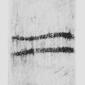二
